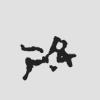降
